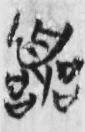囂
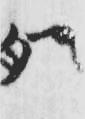肥
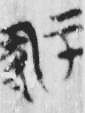冢
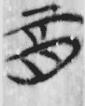酉（酒）
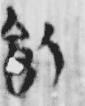○（食）
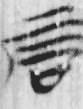石
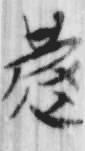被
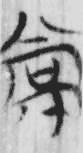常（裳）
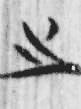之
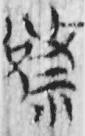○（敓）
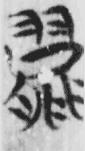○（一）
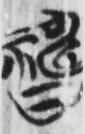禱
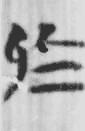於
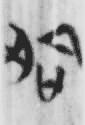卲
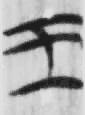王
